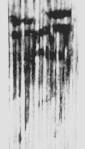競
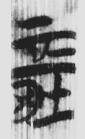坪（平）
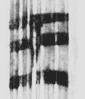王
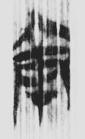○（就）
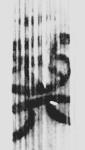奠（鄭）
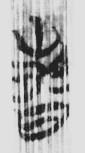壽
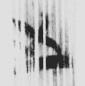之
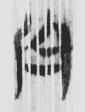於
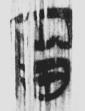○（廟）
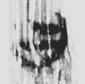曰
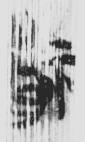○（禍）
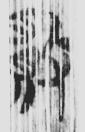敗
